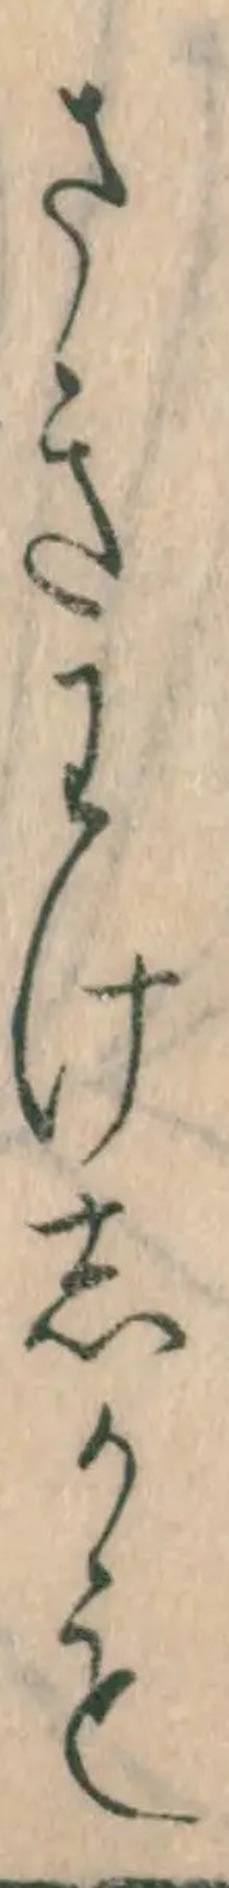さきわけしかも
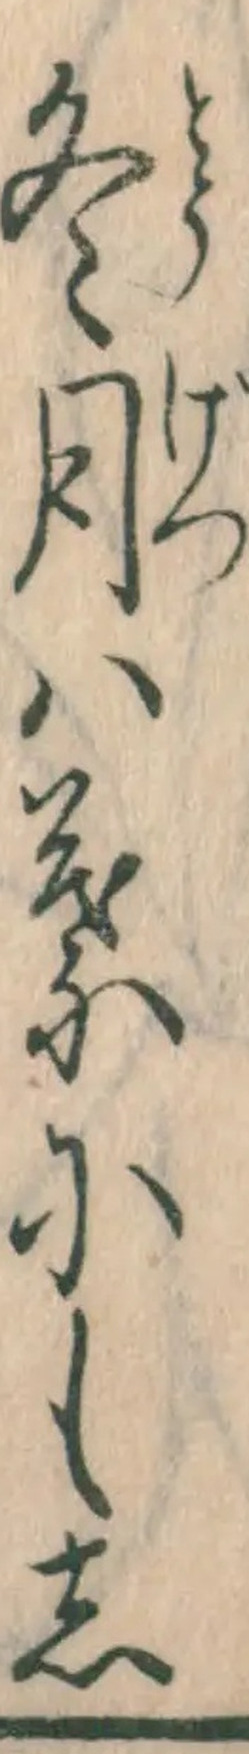冬月は葉にもし
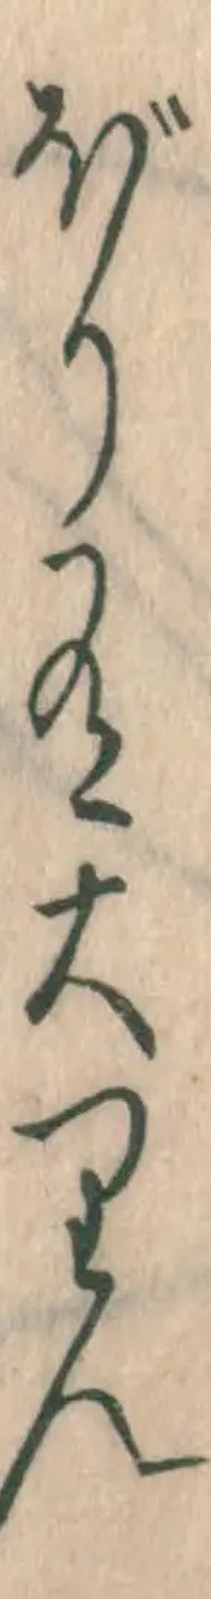ぼり有大りん

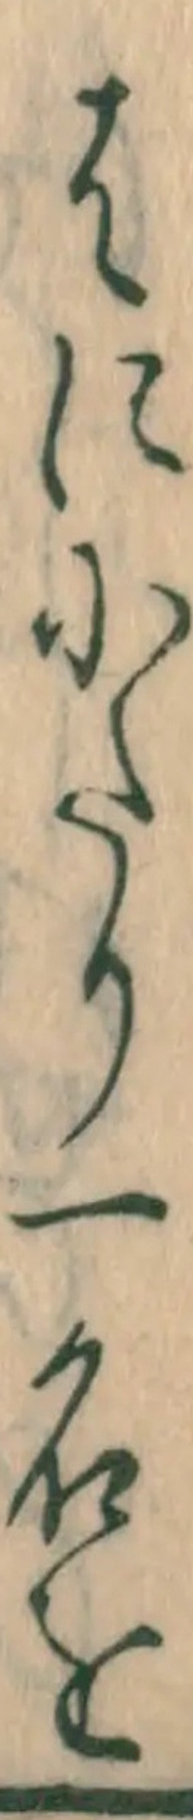はににたり一名を
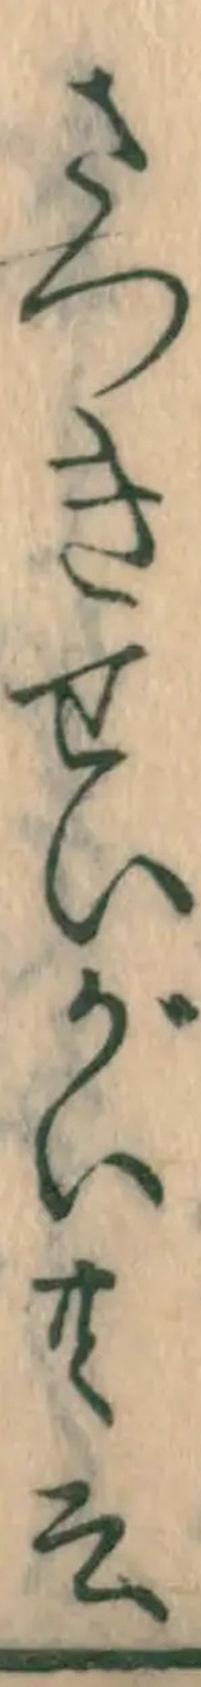さつきせいがい共云
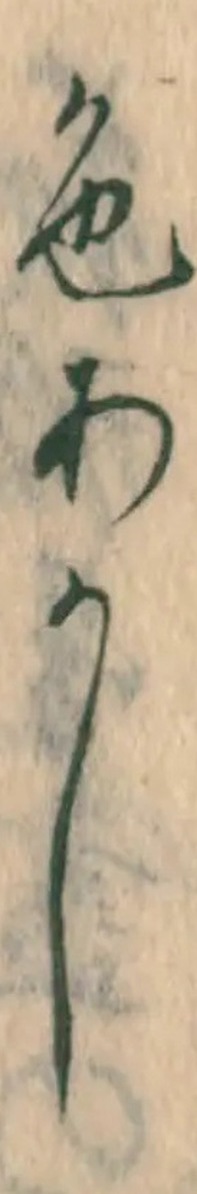色あかし
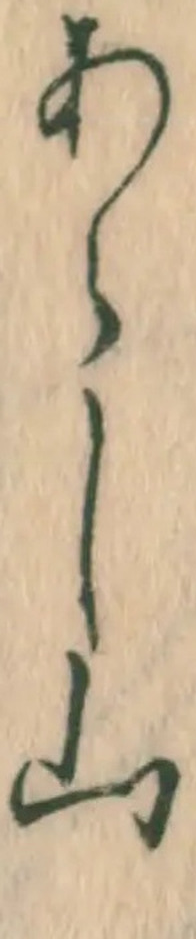あらし山
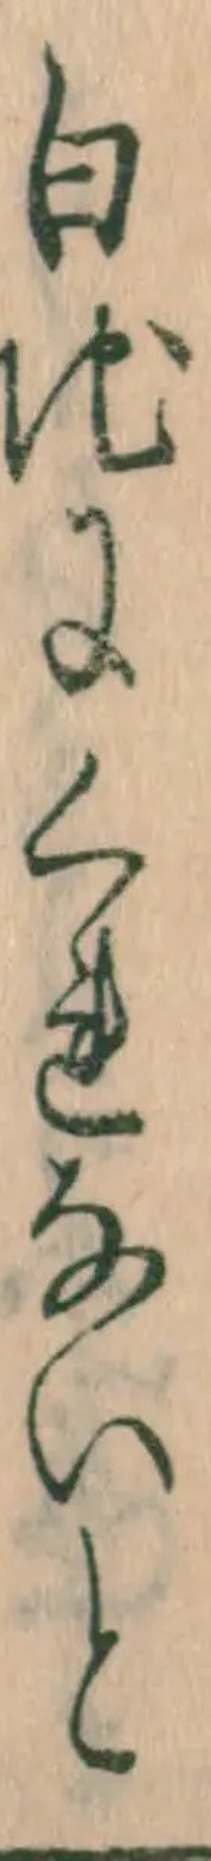白地にくれないと
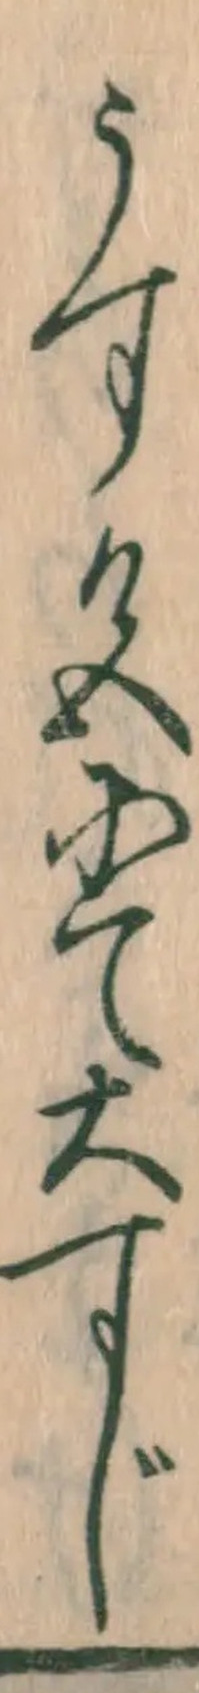うす色にて大すじ
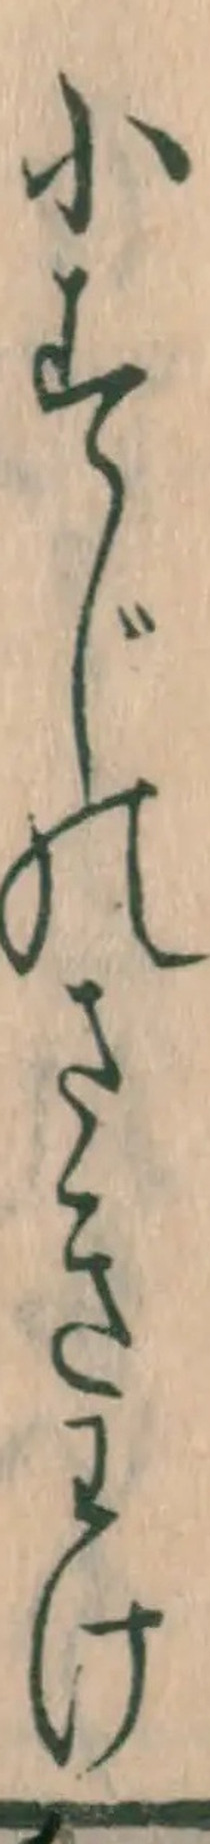小すじのさきわけ
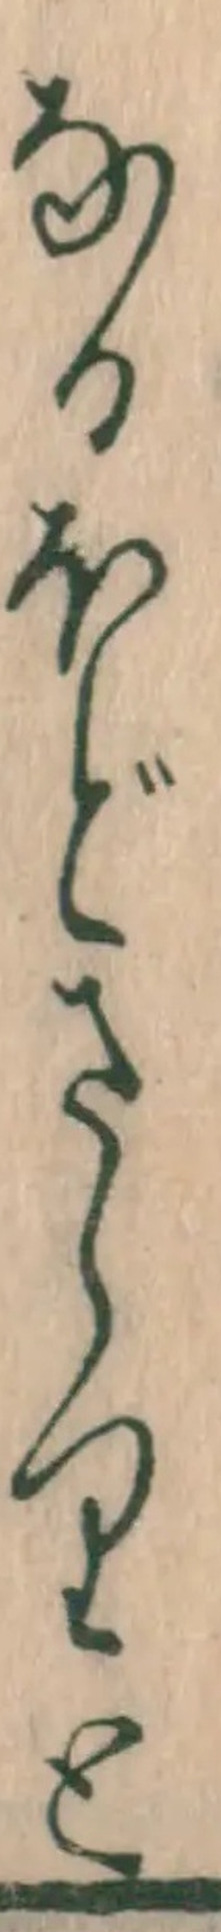なるほどさらりと
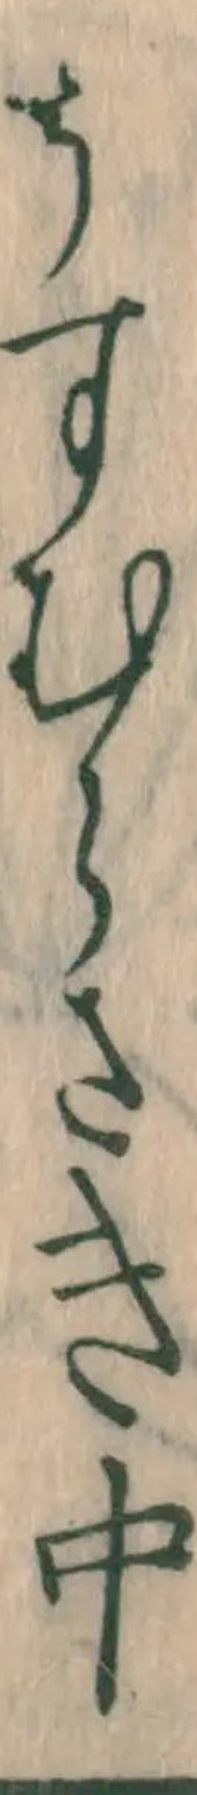うすむらさき中
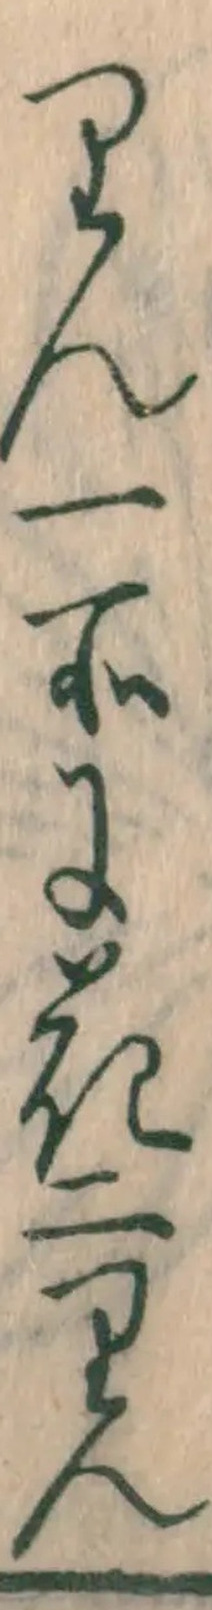りん一所に花二りん
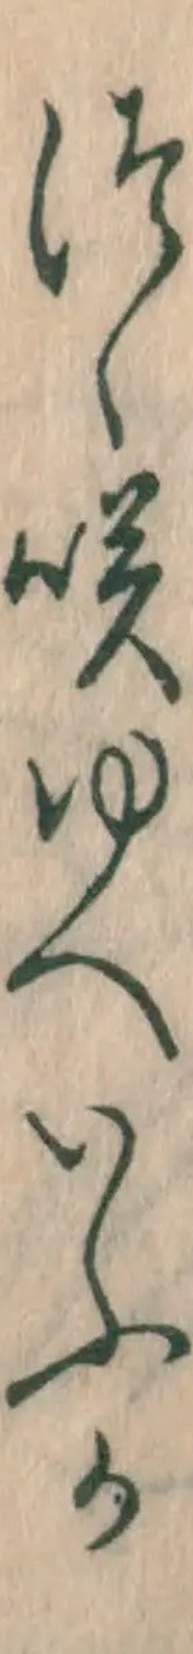つゝ咲ゆへいふか
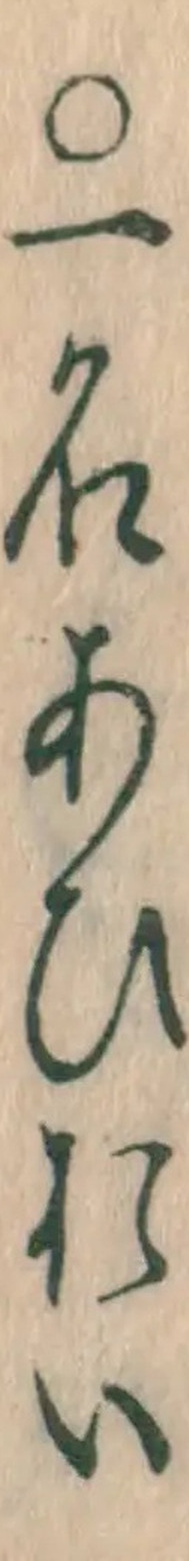○一名あひおい

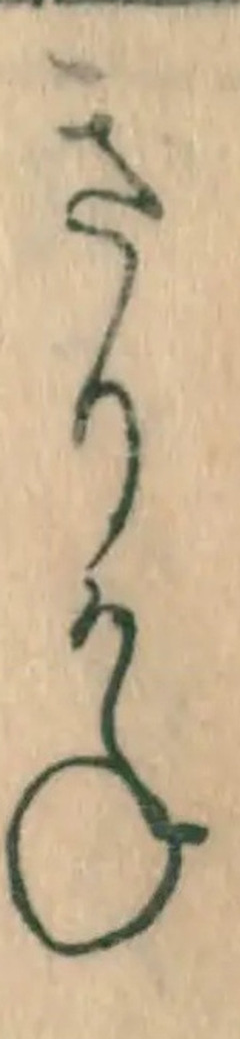きりかね
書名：錦繍枕 5巻. [4]
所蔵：国立国会図書館 National Diet Library, JAPAN
